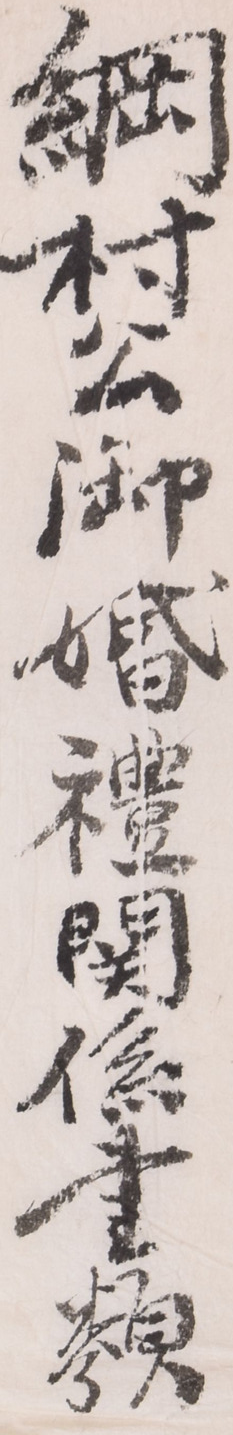綱村公御婚礼関係書類

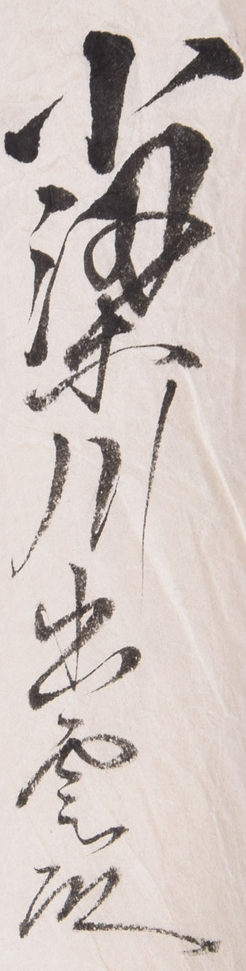小梁川出雲殿
